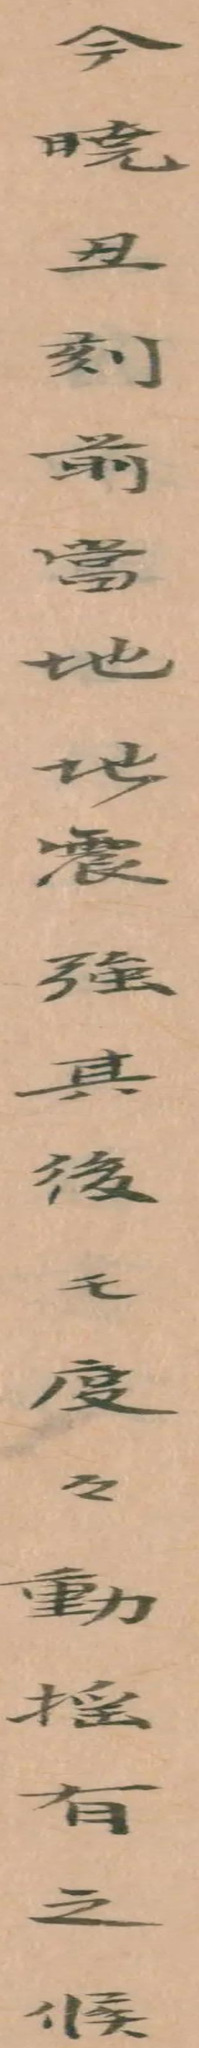今暁丑刻前当地地震強其後モ度々動揺有之候
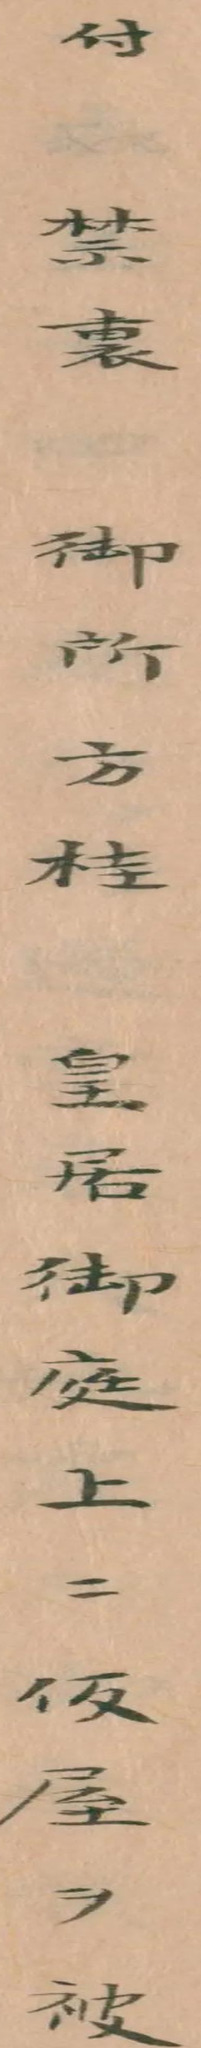付禁裏御所方桂皇居御庭上二仮屋ヲ被
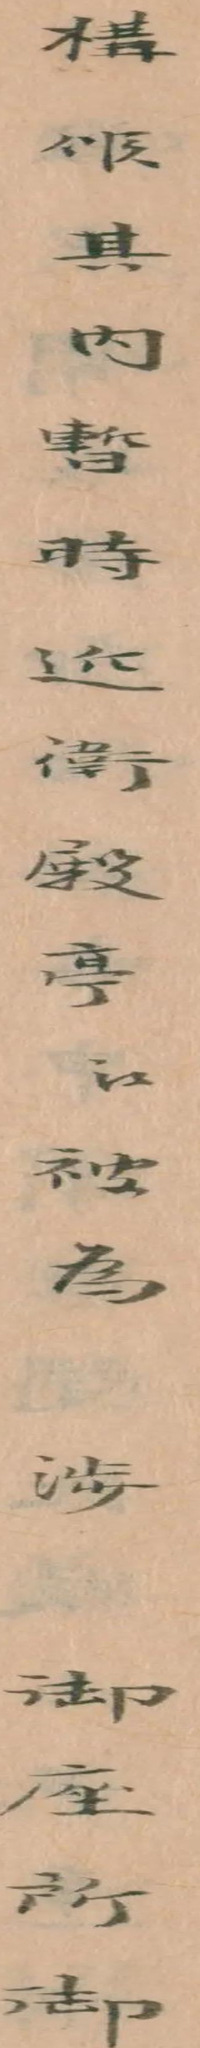構候其内暫時近衛殿亭江被為渉御座所御
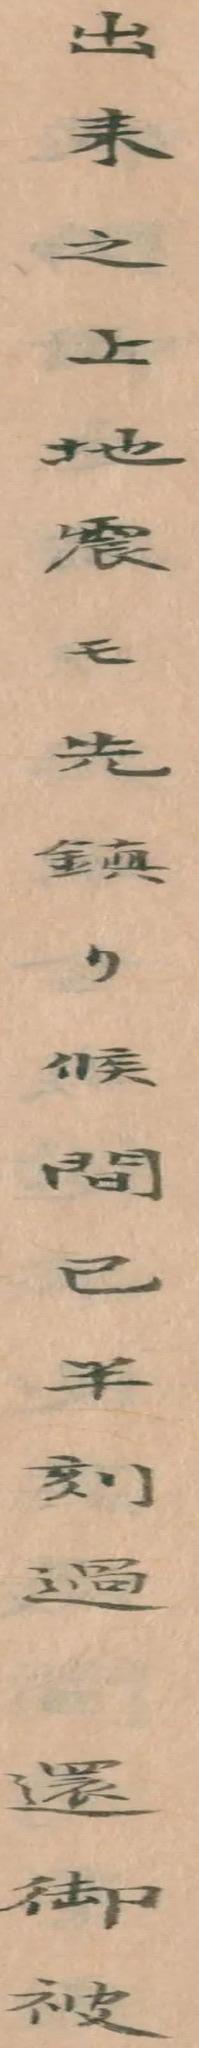出来之上地震モ先鎮り候間巳半刻過還御被
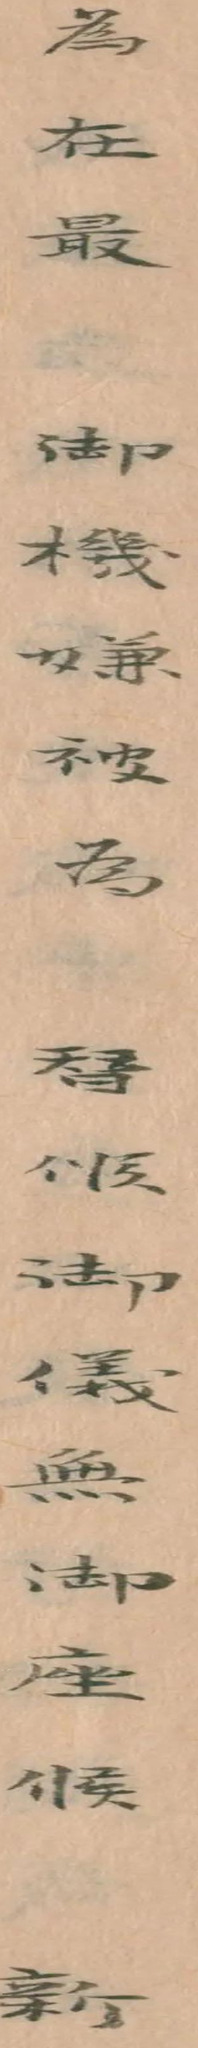為在最御機嫌被為替候御儀無御座候新
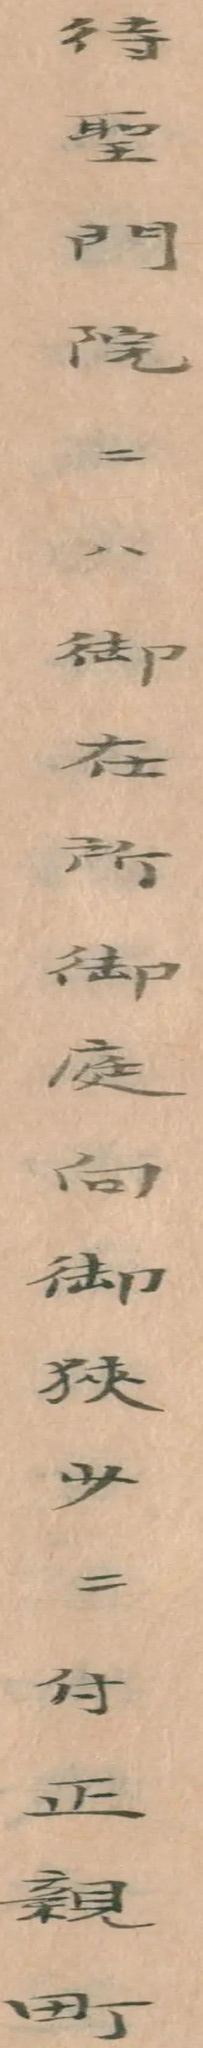待聖門院二ハ御在所御庭向御狭少二付正親町
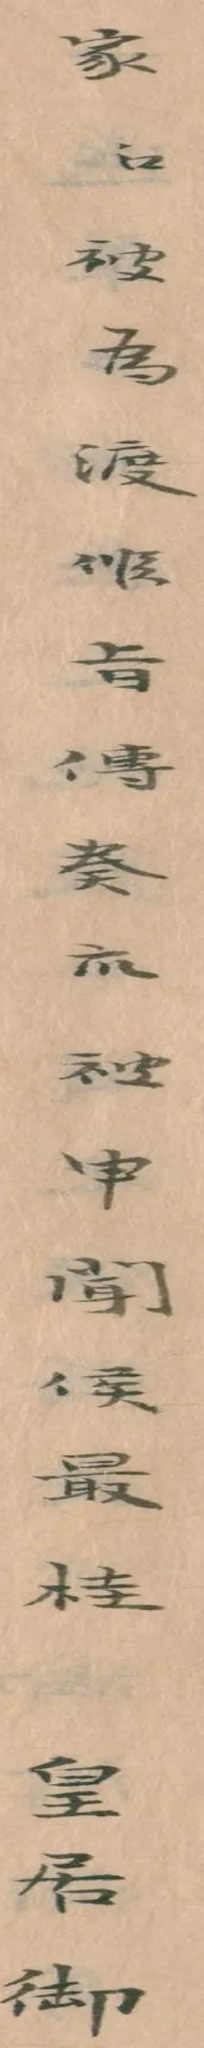家江被為渡候旨伝奏衆被申聞候最桂皇居御
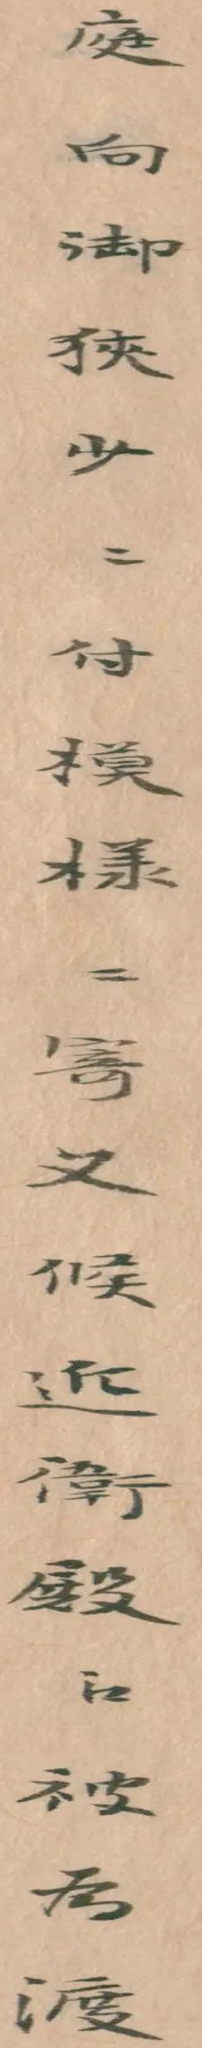庭向御狭少二付模様二寄又候近衛殿江被為渡
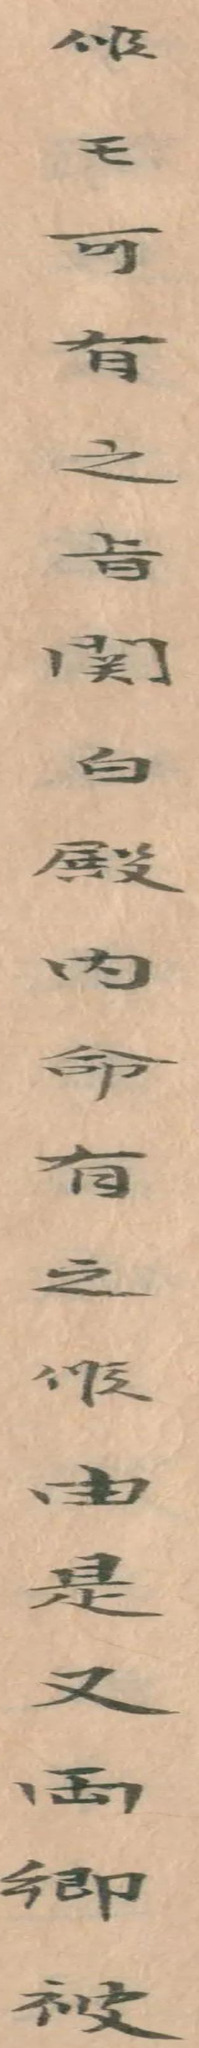候モ可有之旨関白殿内命有之候由是又両卿被

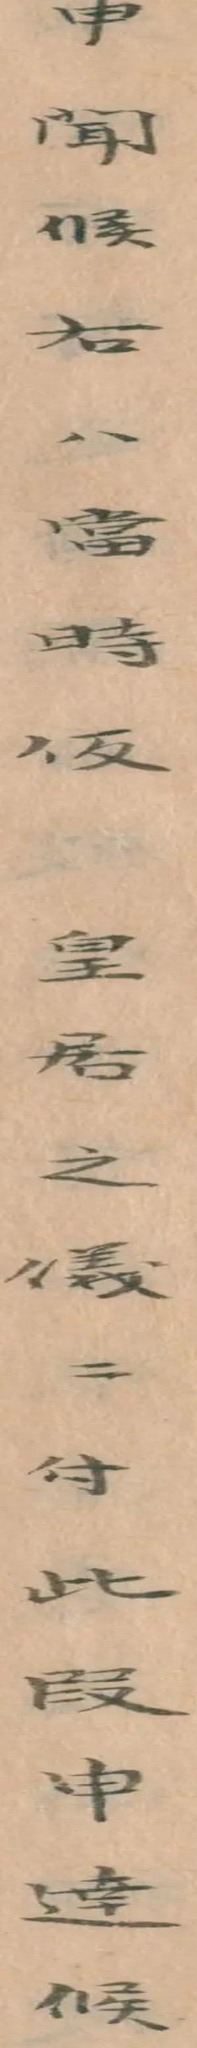申聞候右ハ当時仮皇居之儀二付此段申達候
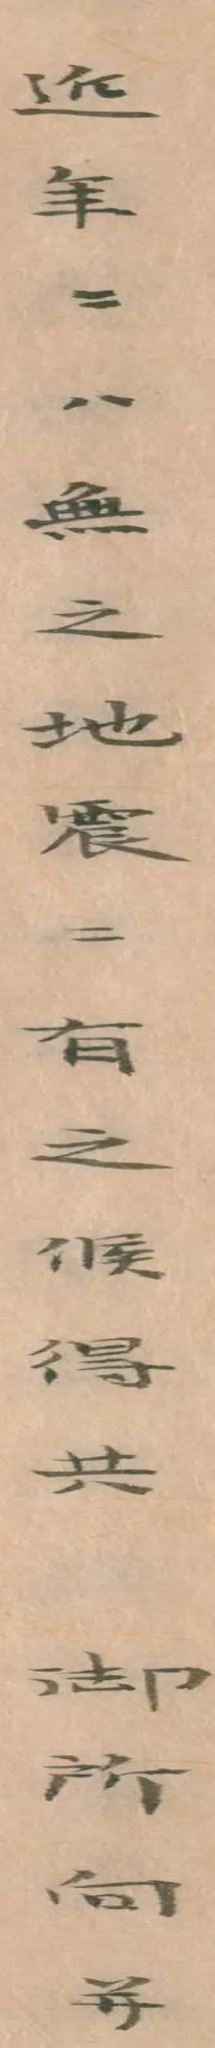一近年二ハ無之地震二有之候得共御所向并
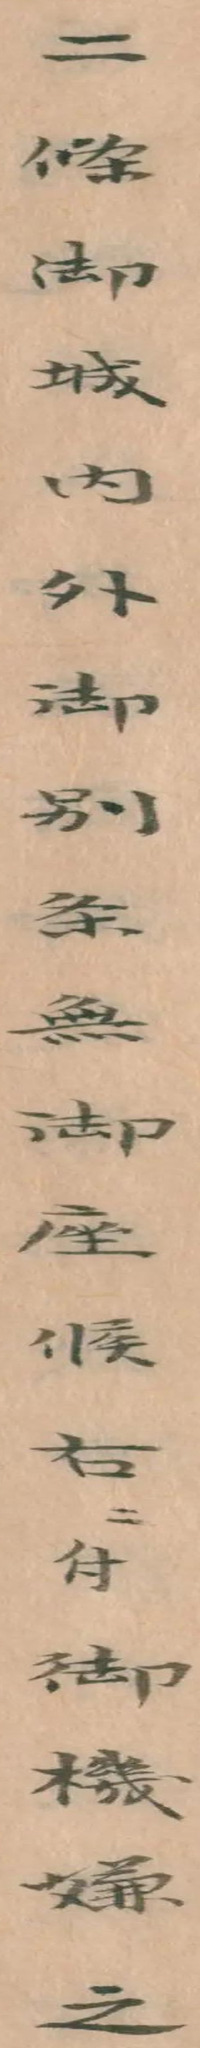二條御城内外御別条無御座候右二付御機嫌之
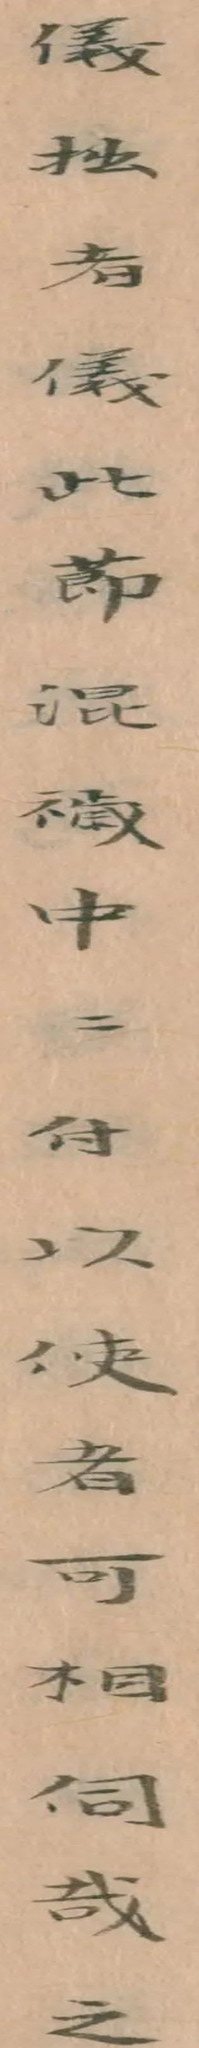儀拙者儀此節混穢中二付以使者可相伺哉之
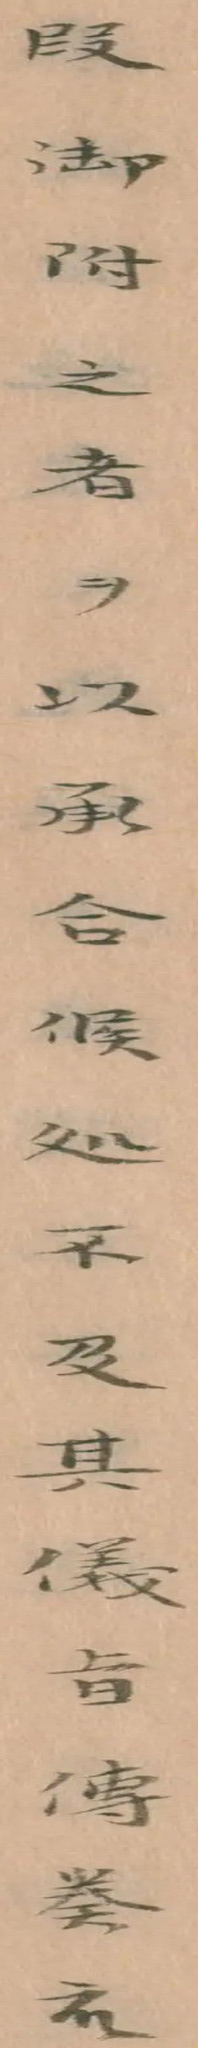段御付之者ヲ以承合候処不及其儀旨伝奏衆
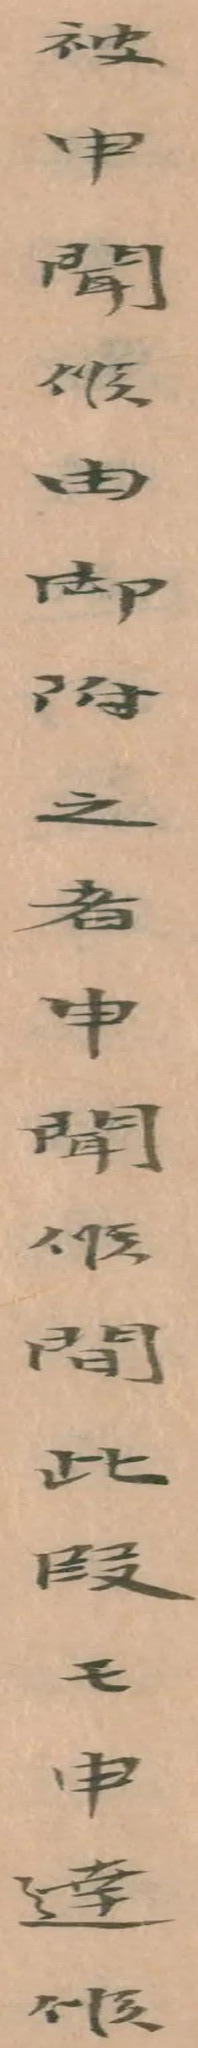被申聞候由御附之者申聞候間此段モ申達候
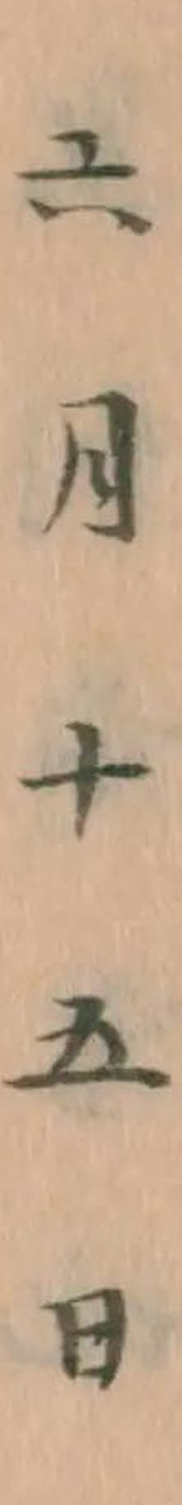六月十五日
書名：地災撮要. 巻1(噴火山・地震ノ部)
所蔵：国立国会図書館 National Diet Library, JAPAN
